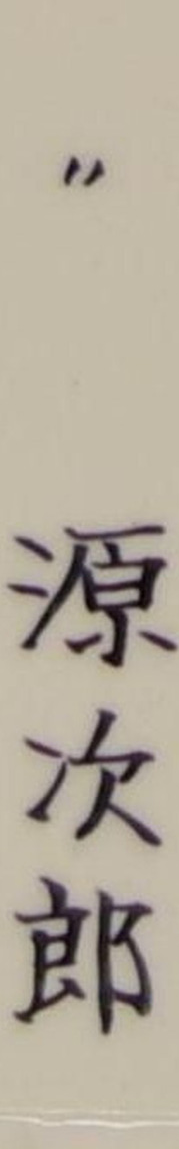源次郎
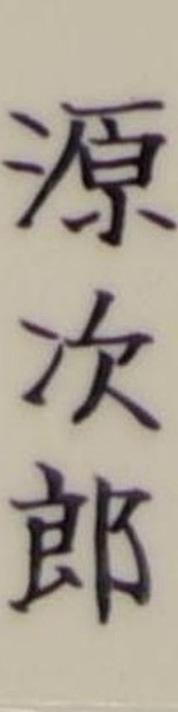源次郎
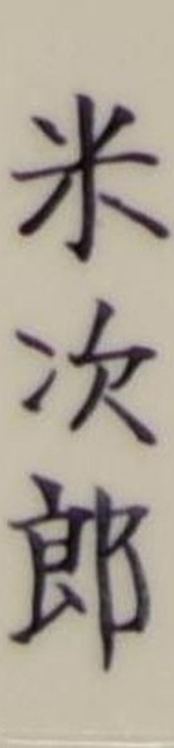米次郎
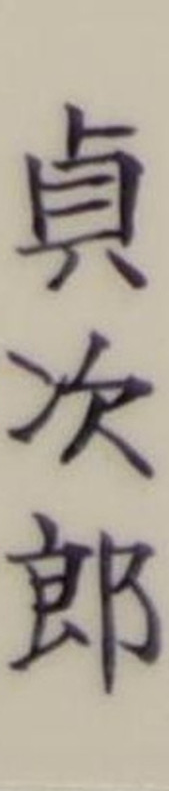貞次郎

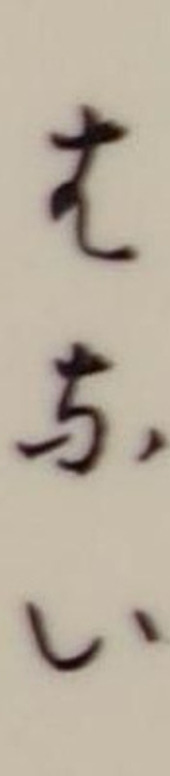はない
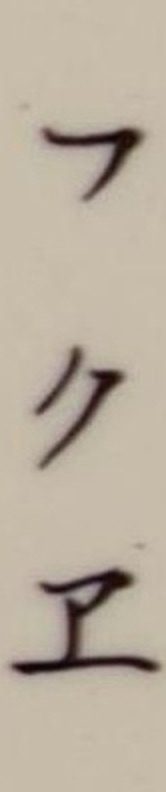フクエ
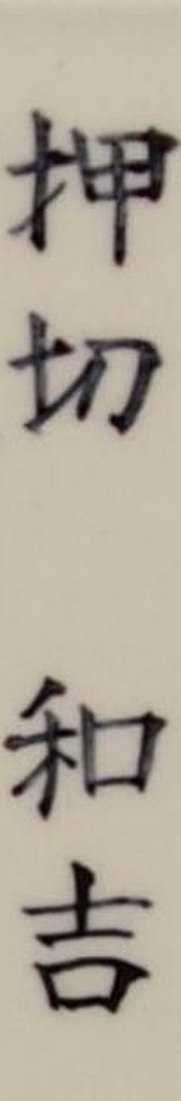押切和吉
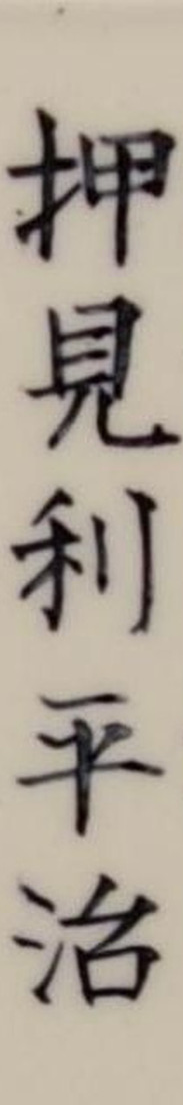押見利平治
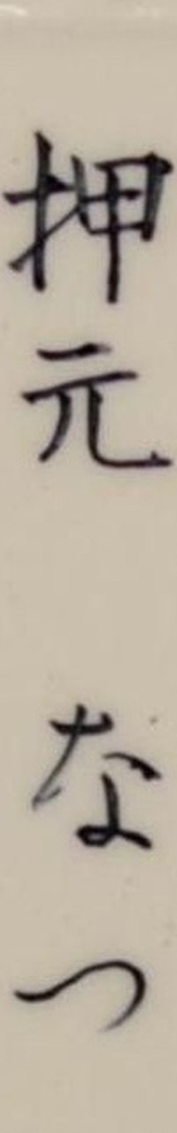押元なつ
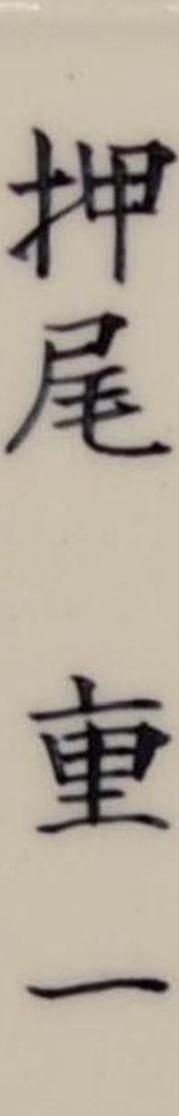押尾重一
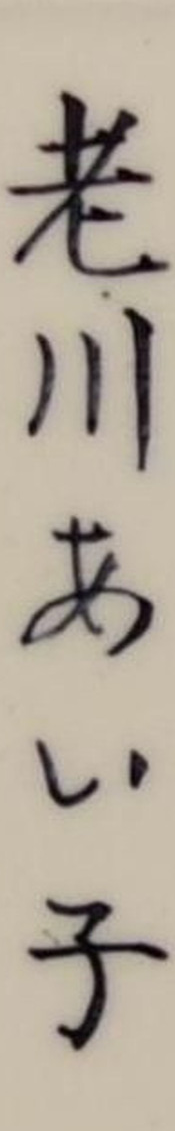老川あい子
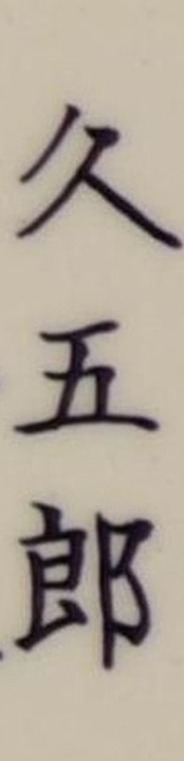久五郎
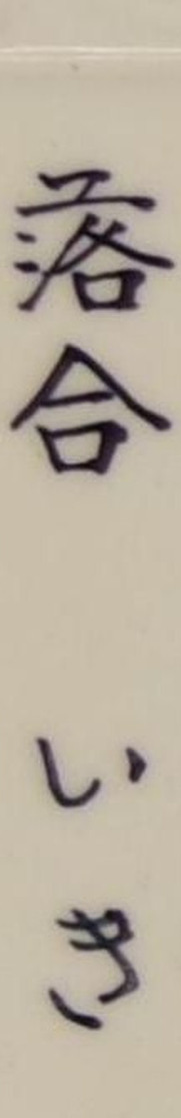落合いき

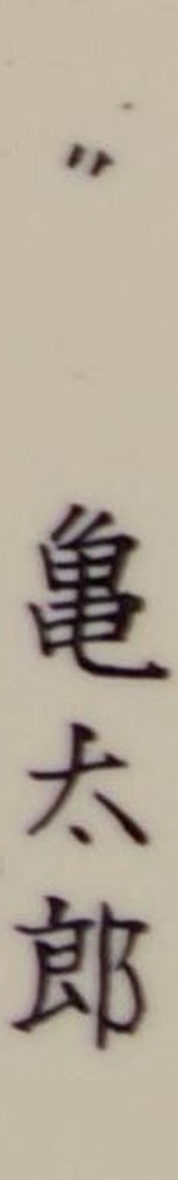亀太郎
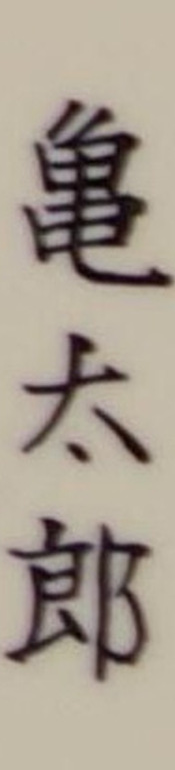亀太郎
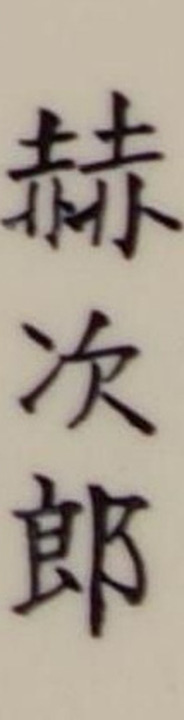赫次郎
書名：E~L
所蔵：高野山金剛峯寺
